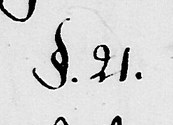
§.21.
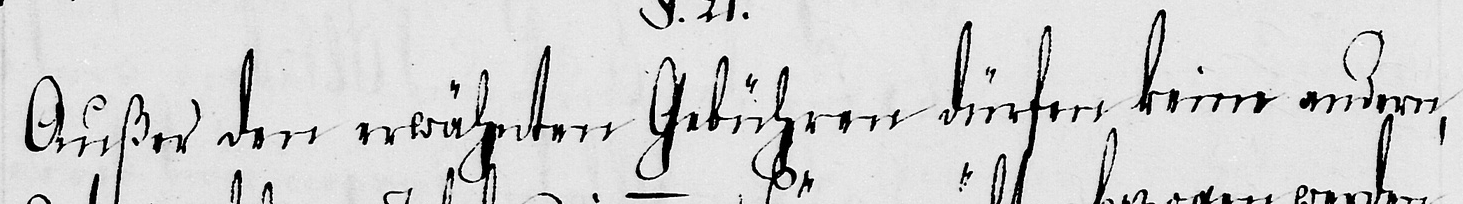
Außer den erwähnten Gebühren dürfen keine andern,
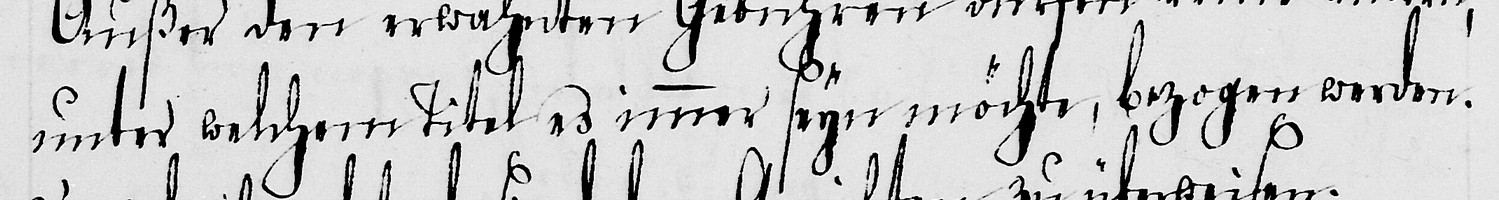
unter welchem Titel es immer seyn möchte, bezogen werden.
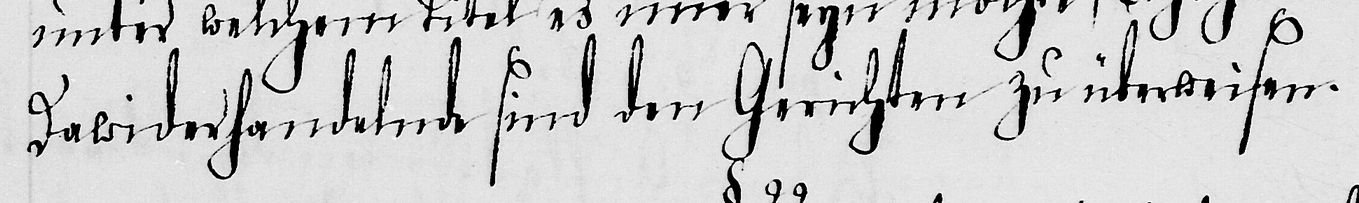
Dawiderhandelnde sind den Gerichten zu überweisen.
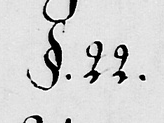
§.22.
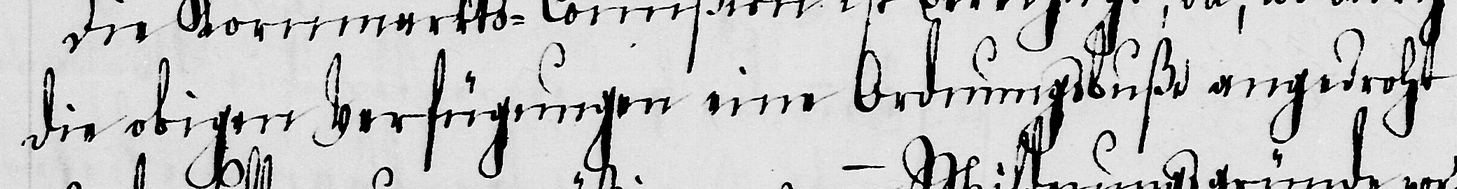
die obigen Verfügungen eine Ordnungsbuße angedroht
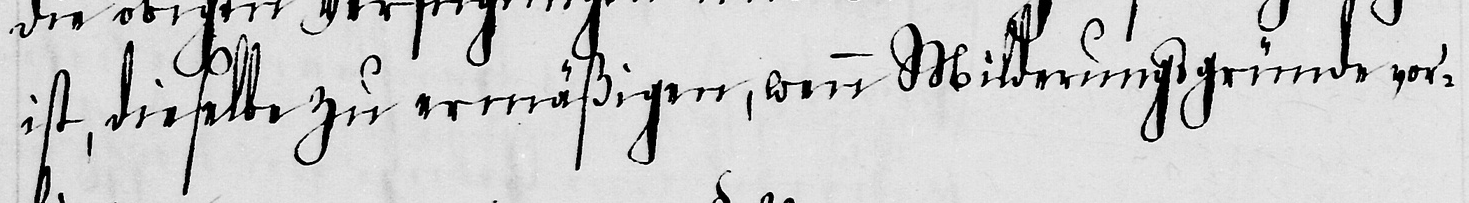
ist, dieselbe zu ermäßigen, wenn Milderungsgründe vor¬
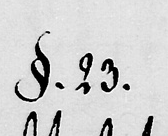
§.23.
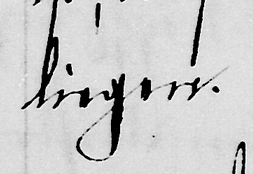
liegen.
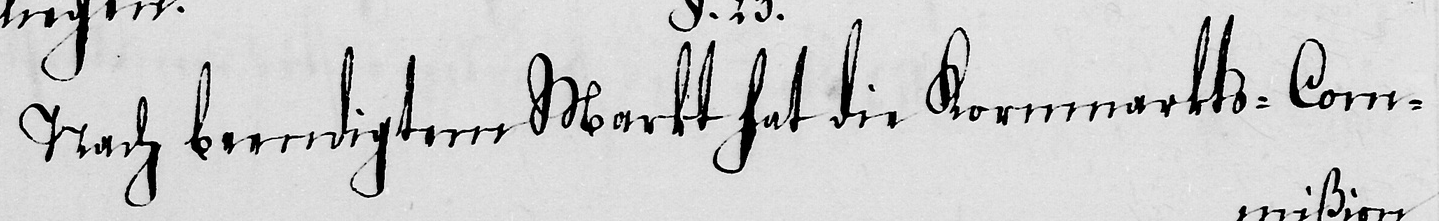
Nach beendigtem Markt hat die Kornmarkts-Com-
